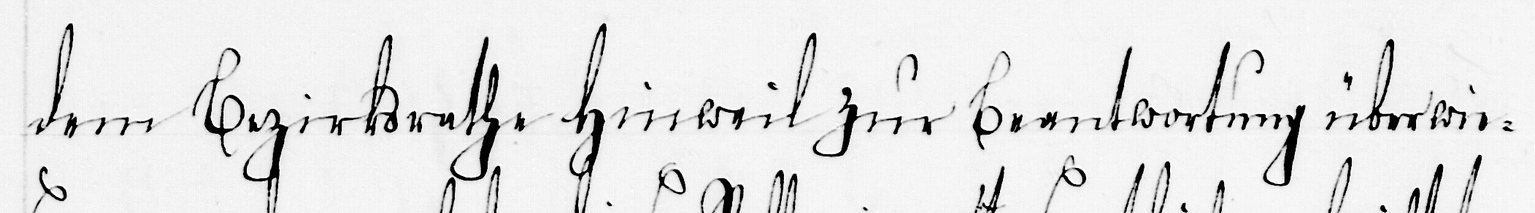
dem Bezirksrathe Hinweil zur Beantwortung überwie¬
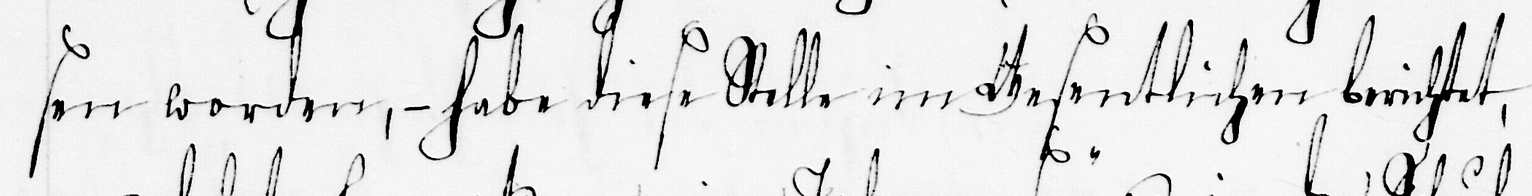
sen worden, – habe diese Stelle im Wesentlichen berichtet,
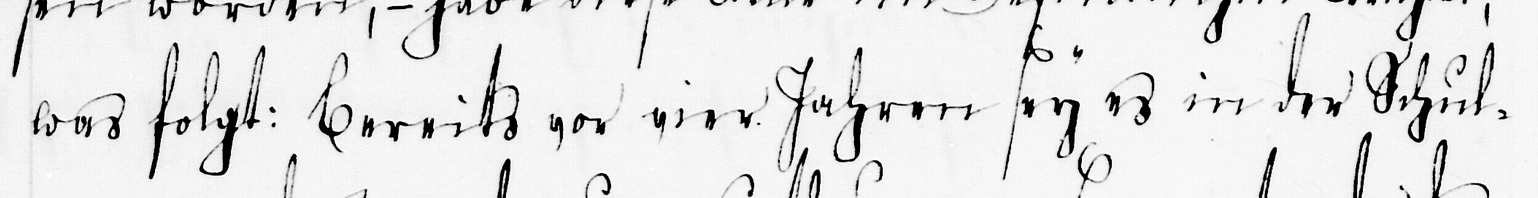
was folgt: Bereits vor vier Jahren sey es in der Schul¬
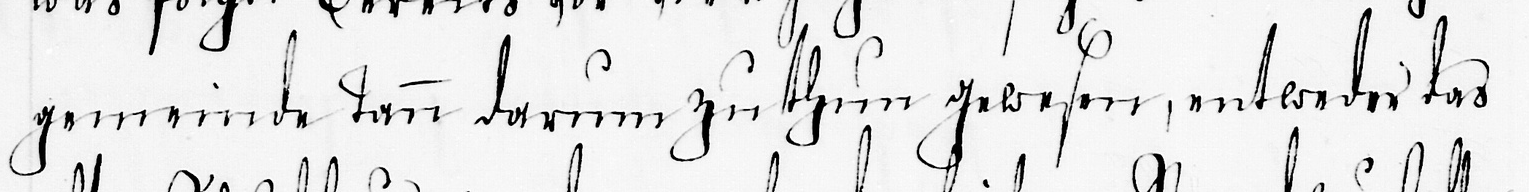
gemeinde Tann darum zu thun gewesen, entweder das
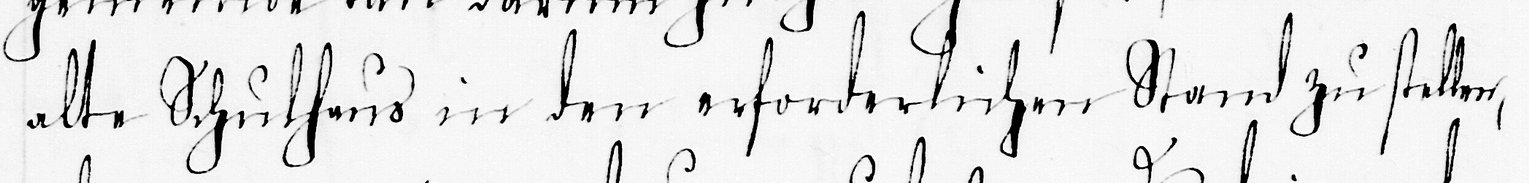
alte Schulhaus in den erforderlichen Stand zu stell¬
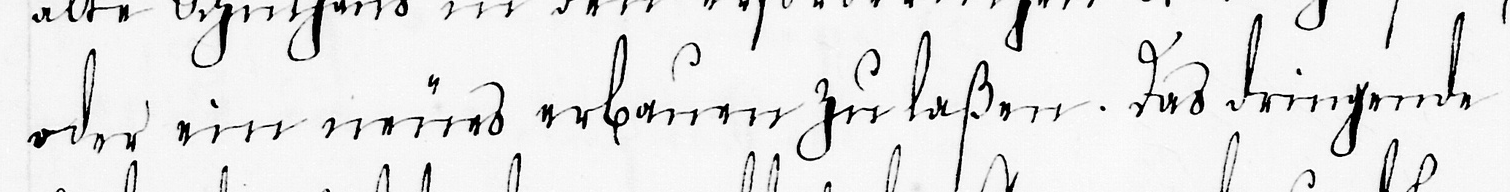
oder ein neues erbauen zu laßen. Das dringende
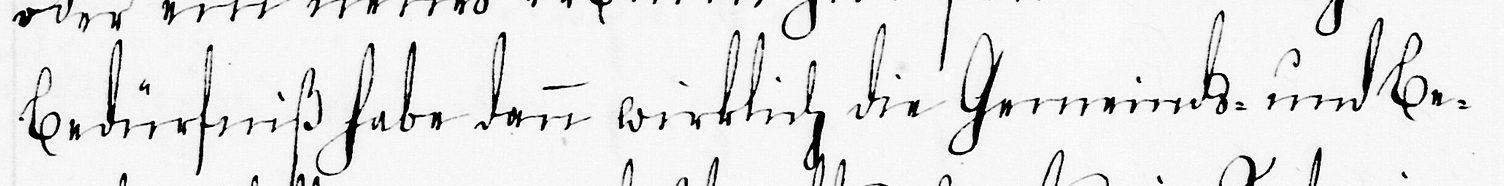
Bedürfniß habe dann wirklich die Gemeinds- und Be¬
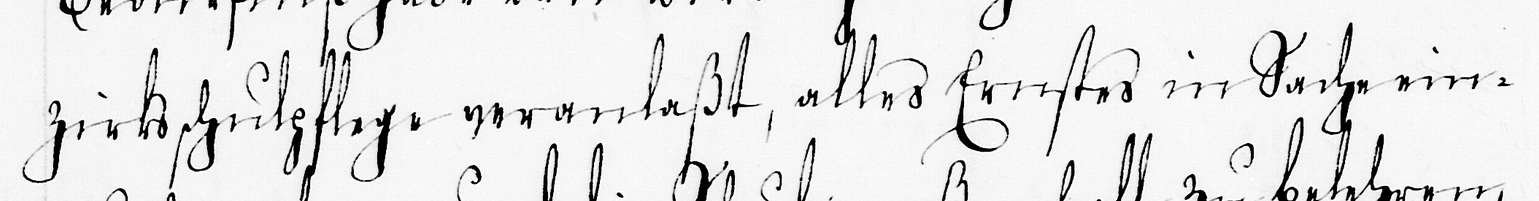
zirksschulpflege veranlaßt, alles Ernstes in Sache ein¬
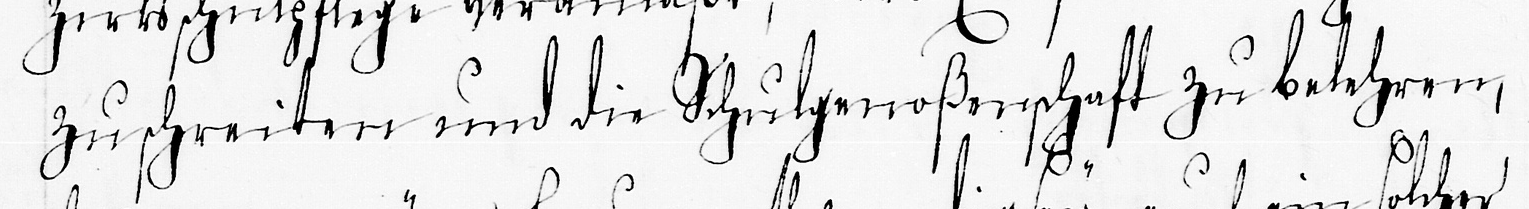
zuschreiten und die Schulgenoßenschaft zu belehren,
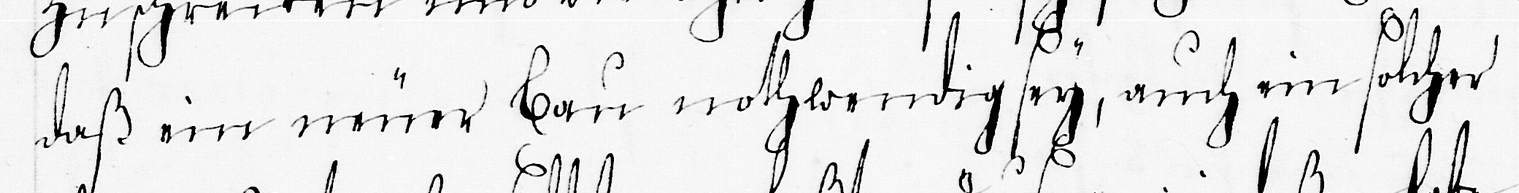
daß ein neuer Bau nothwendig sey, auch ein solcher
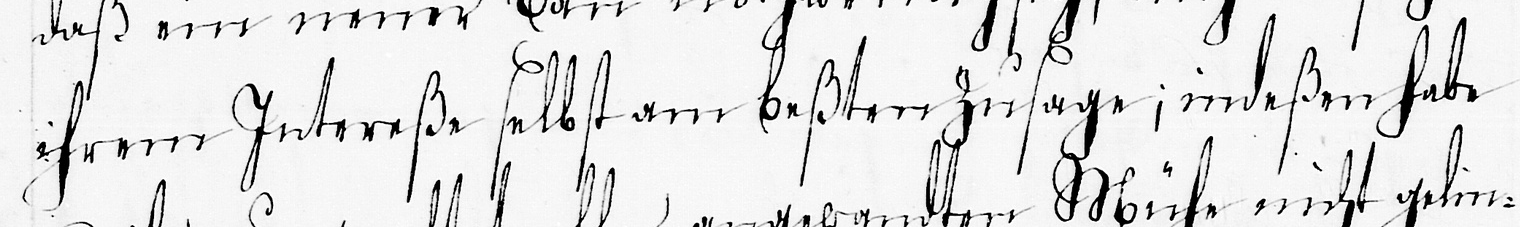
ihrem Intereße selbst am beßten zusage, indeßen habe
